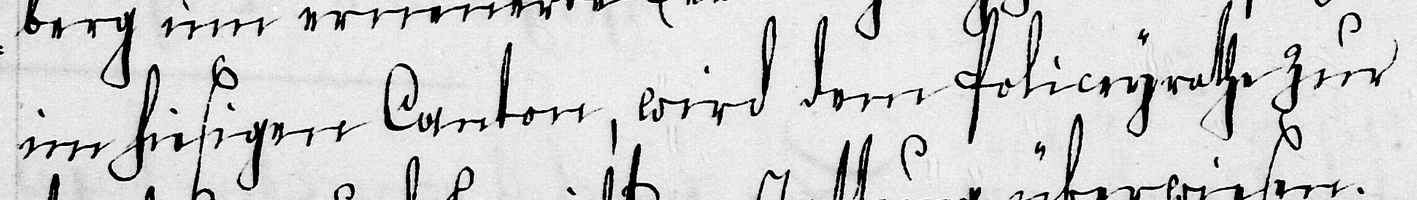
im hiesigen Canton, wird dem Policeyrathe zur
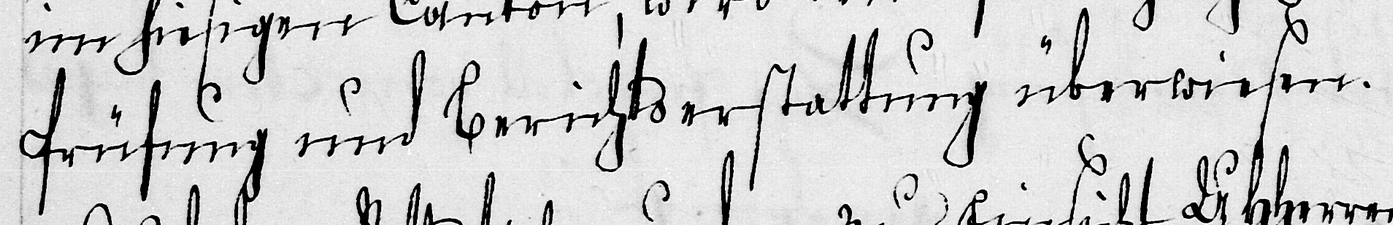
Prüfung und Berichtserstattung überwiesen.
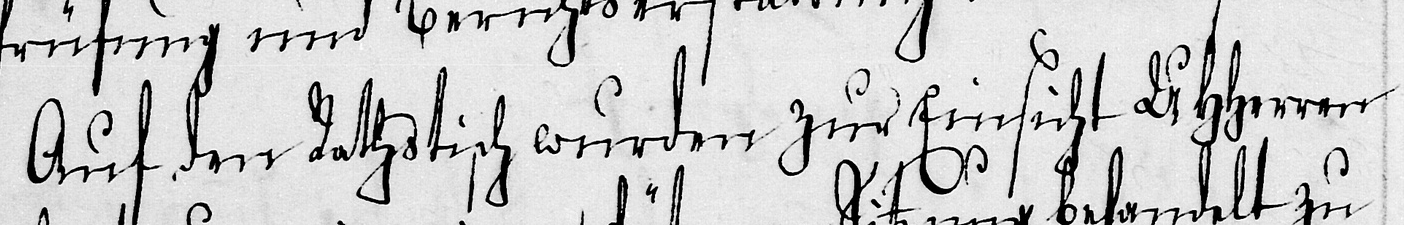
Auf den Rathstisch wurden zur Einsicht UHHerren
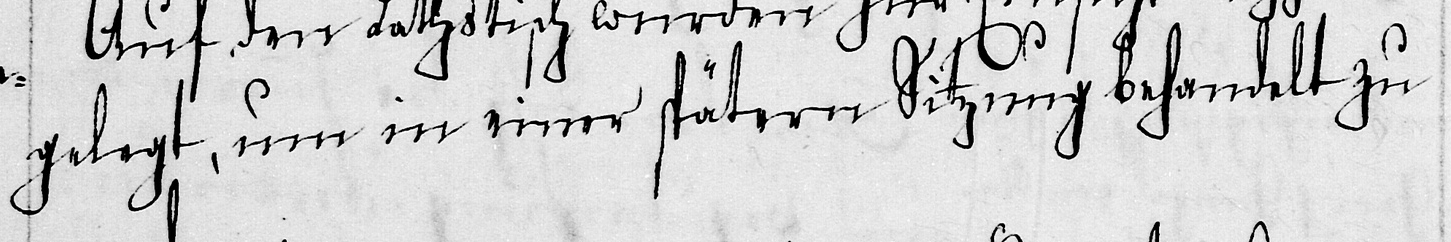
gelegt, um in einer spätern Sitzung behandelt zu
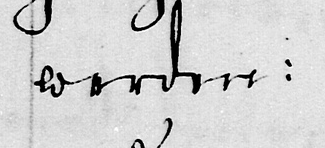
werden:
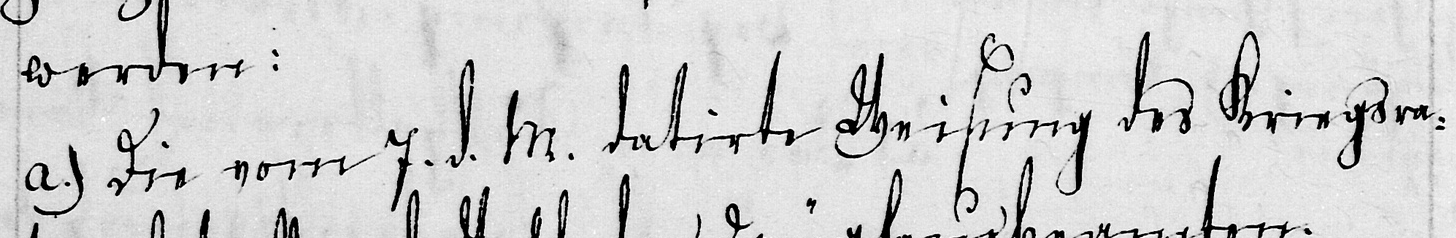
a.) Die vom 7. d. M. datirte Weisung des Kriegsra¬
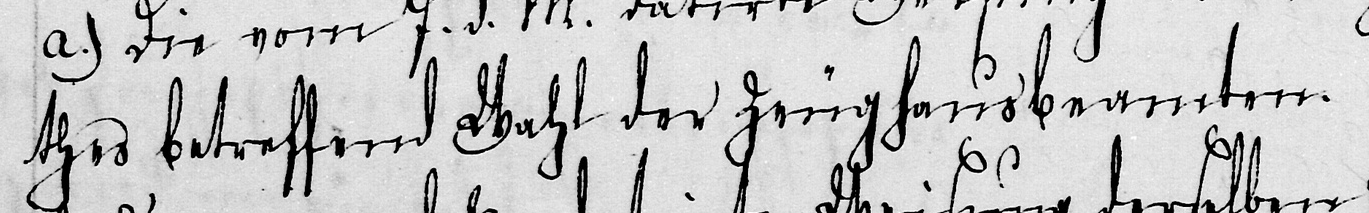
thes betreffend Wahl der Zeughausbeamten.
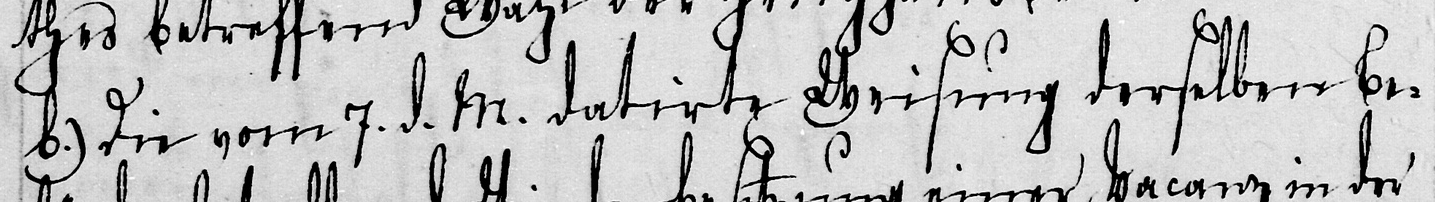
b.) Die vom 7. d. M. datirte Weisung derselben Be¬
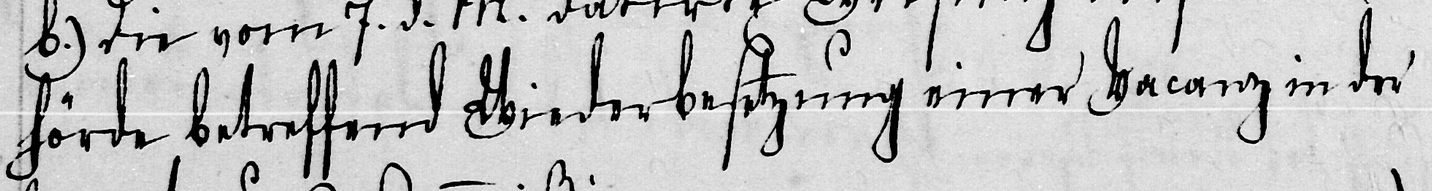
hörde betreffend Wiederbesetzung einer Vacanz in der
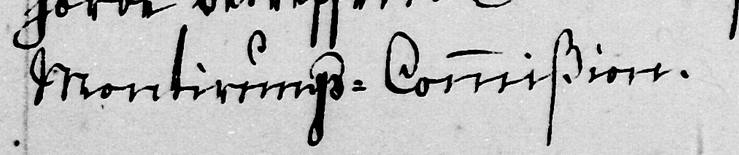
Montirungs-Commißion.
